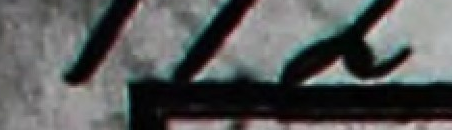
772
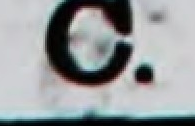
C.
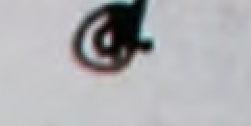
S.
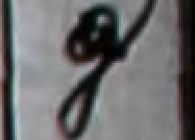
G
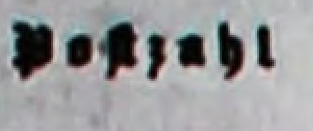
Postzahl
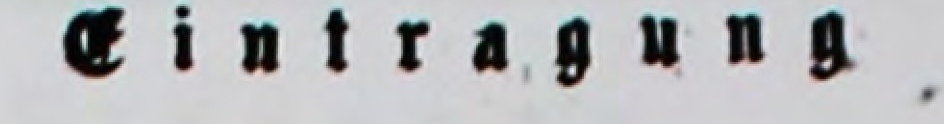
Eintragung
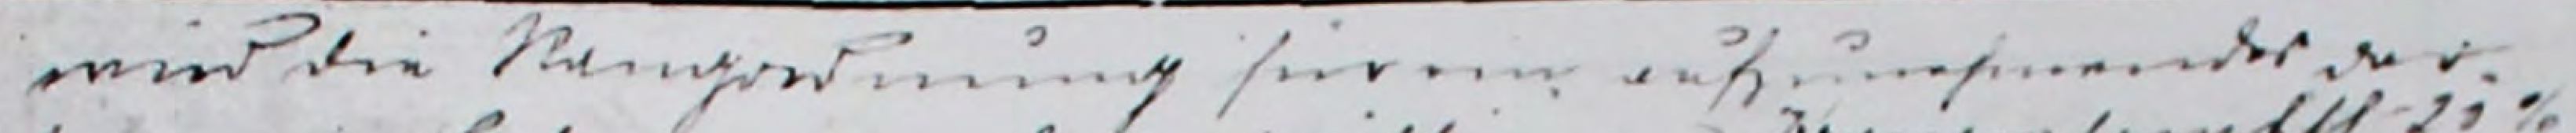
wird die Rangordnung für ein aufzunehmendes Dar„
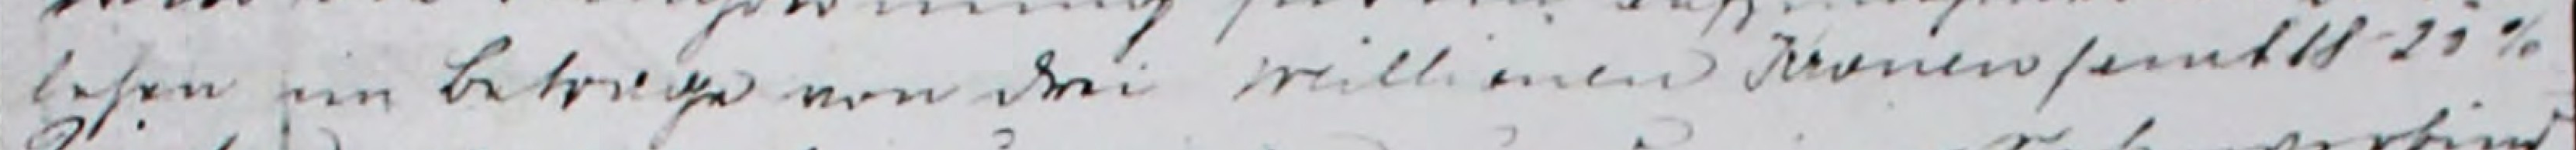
lehen ein Betrage von drei Millienen Kronen samt 18-20 %
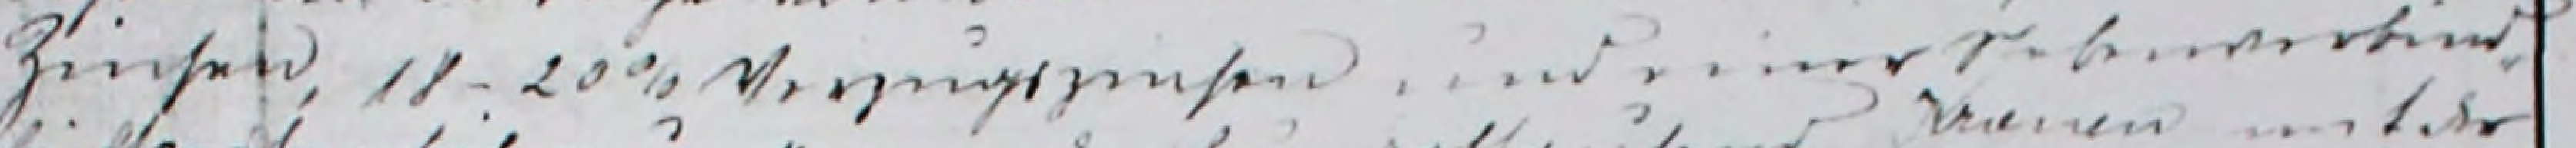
Zinsen, 18-20 % Verzugszinsen und einer Nebenverbind
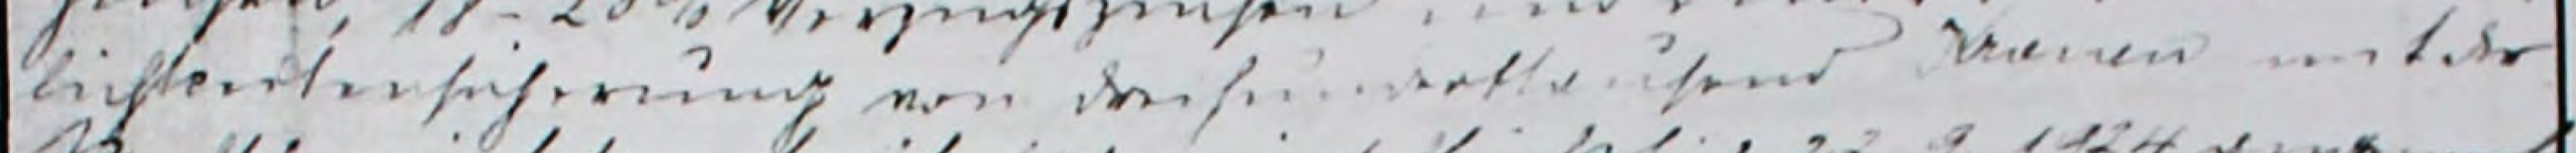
lichkeitensicherung von den dreihunderttausend Kronen mit der
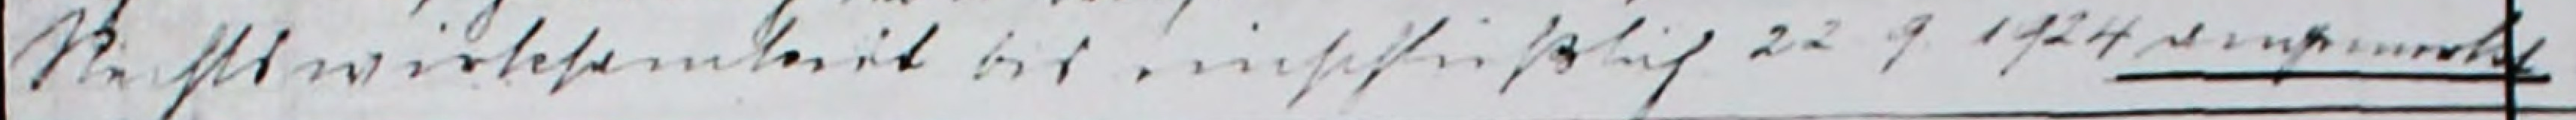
Rechtswirksamkeit bis einschließlich 22.9.1924 angemerkt
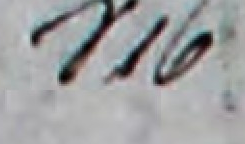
s 16
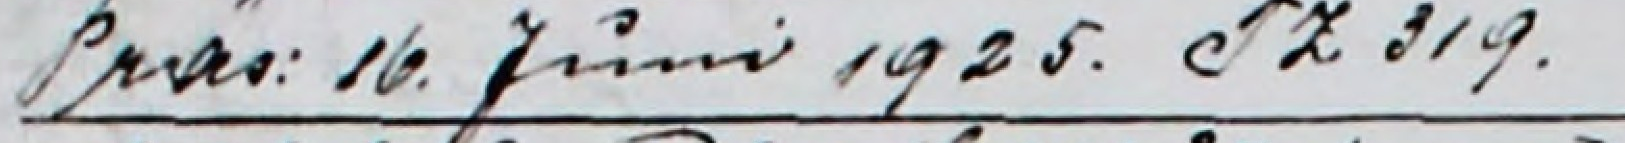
Präs: 16. Juni 1925. T Z 319.
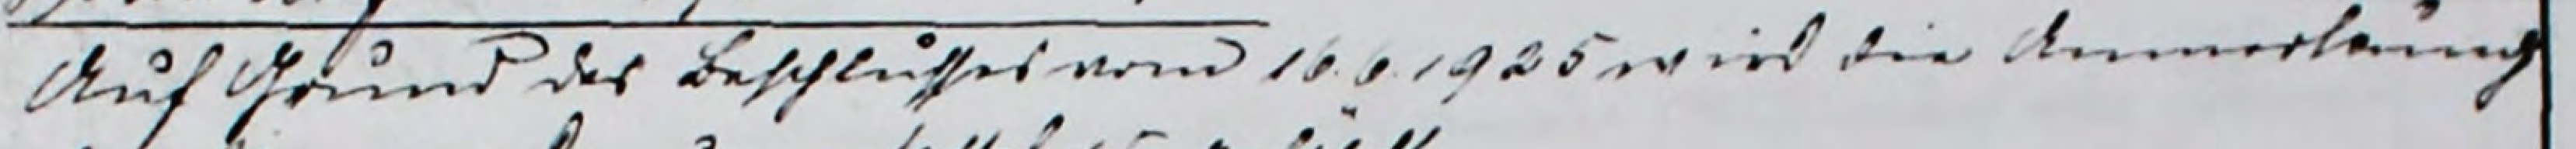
Auf Grund des Beschlusses vom 16.6.1925 wird die Anmerkung
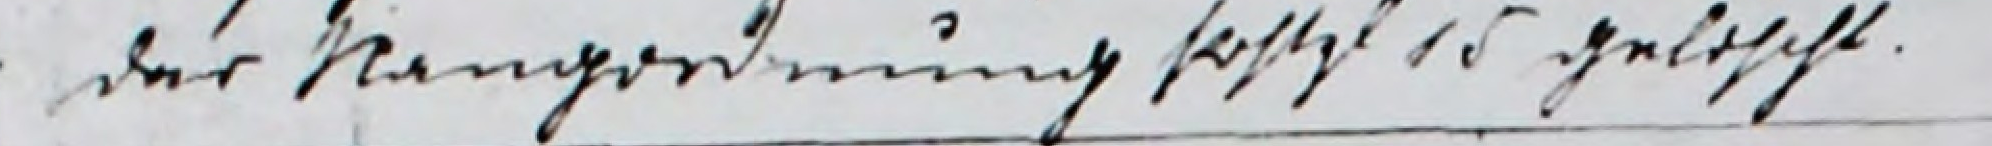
der Rangordnung Postzl 15 gelöscht.
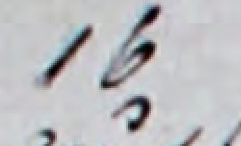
16
